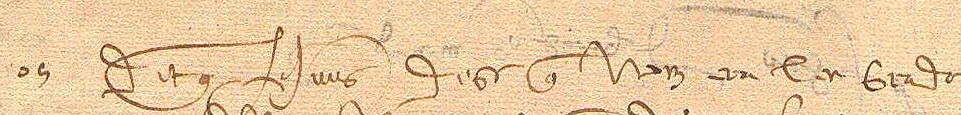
os ditꝯ JeJūus dise q̄ nom era lembrada
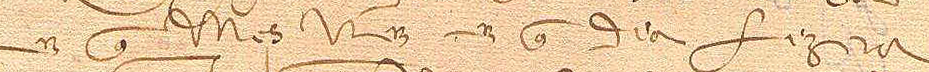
em q̄ Mes Nem em q̄ dia fizera
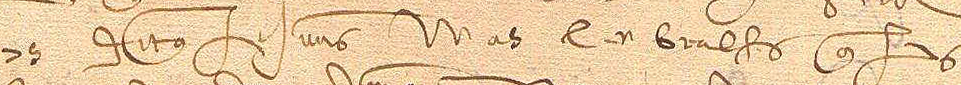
os dit̄ꝯ JeJūus Mas lembralhes q̄ hos
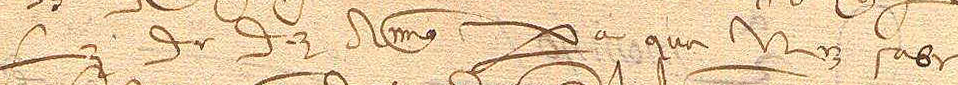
fez de dez Ann̄ꝯ ꝑa qua Nem sabe
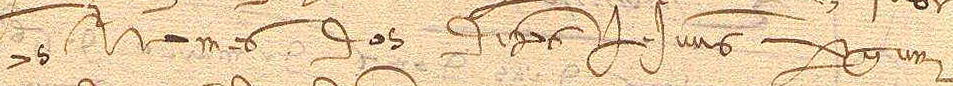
os nomes dos dit̄os Jejūus ꝑgum
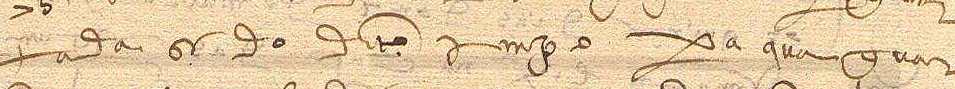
tada se do dīto tempo ꝑa qua guar
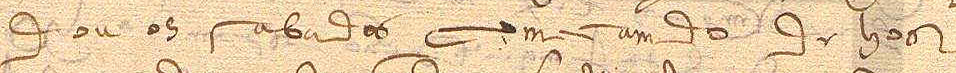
dou os sabados comecamdo de hos
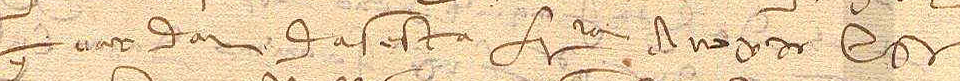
guardar da sesta frra A noyte E se
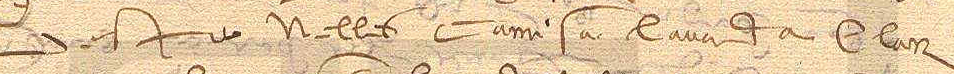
Vestio nelles camisa lauada E lan
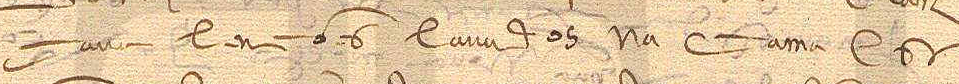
caua lencōes lauados na cama E se
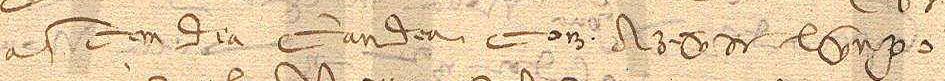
asçemdia Candea Com Azeyte lynpo
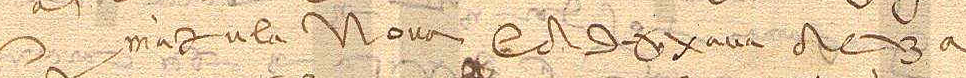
e matula Noua e A deyxaua Açeza
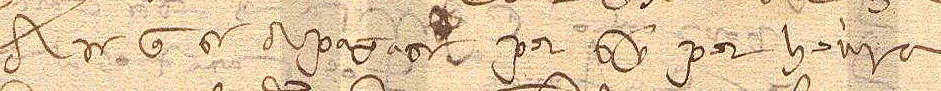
Ate q̅ se Apagase por sy por honra
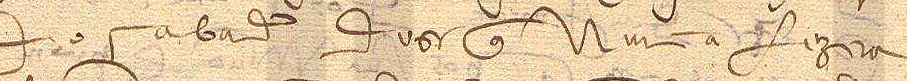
do sabado dise q̄ Nunca fizera
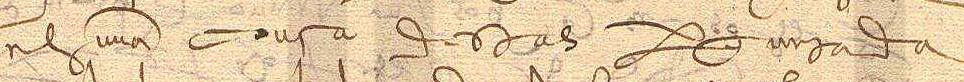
nhūua cousa destas ꝑguntada
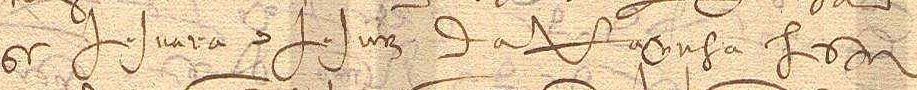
se JeJuara o JeJum da Raynha hester
